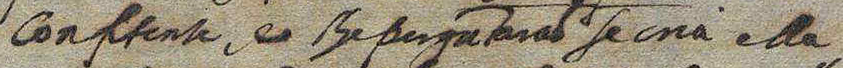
confitente, e lhe pergūtaraõ se cria ella
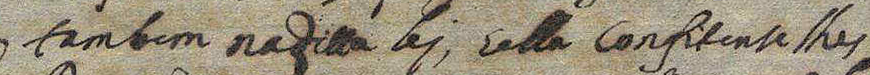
tambem na ditta lej, E ella confitente lhes
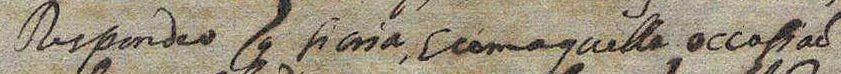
Respondeo q̄ si cria, E com aquella occasiaõ
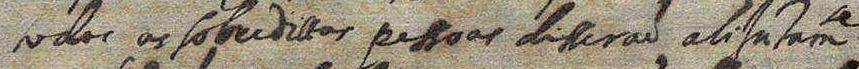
todas as sobredittas pessoas disseraõ ali Jūtamte
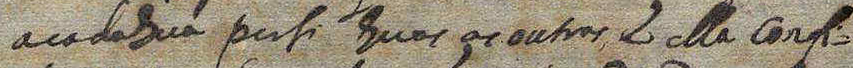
a cada huā per si huas as outras, & ella confi
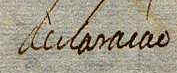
declaraçaõ
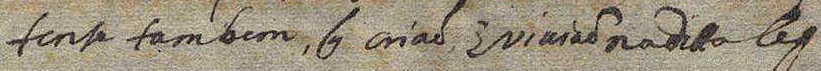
tente tambem, q̄ criaõ E viuiaõ na ditta ley
